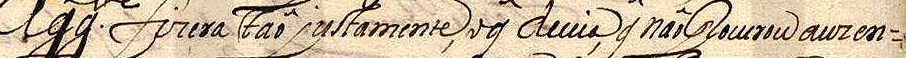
Agg.te fizera taõ justamente, o q̄ deuia, q̄ naõ procurou auzen
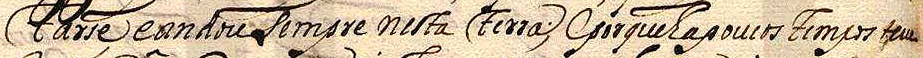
tarse, e andou sempre nesta terra; e porque ha poucos tempos teue
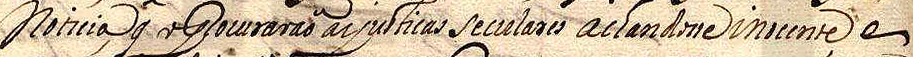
noticia, q̄ o procuraraõ as justiças seculares achandosse inocente e
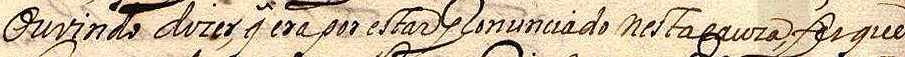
ouvindo dizer, q̄ era por estar pronunciado nesta cauza, fez que
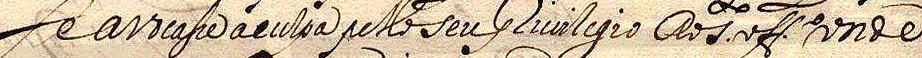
se avocasse a culpa pello seu priuilegio ao s.to off.o onde
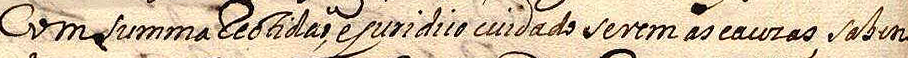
com summa Rectidaõ, e juridico cuidado serem as cauzas, saben
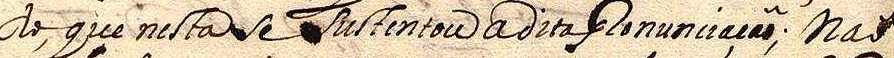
do, que nesta se sustentou a dita pronunciaçaõ; naõ
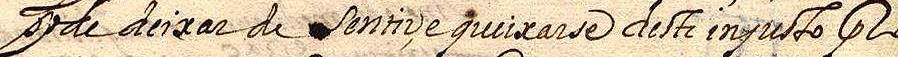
pode deixar de sentir, e queixarse deste injusto pro
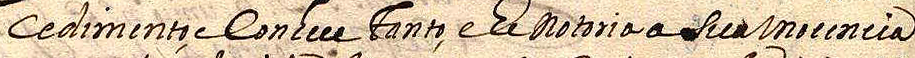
cedimento, e conhece tanto, e he notoria a sua inocencia
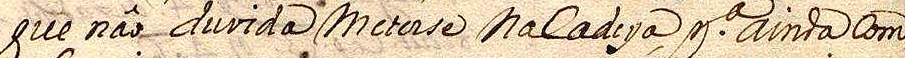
que naõ duvida meterse na Cadeya, p.a ainda com
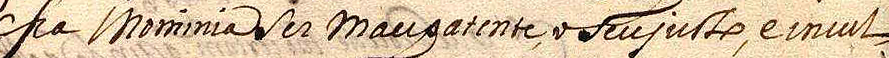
essa inominia ser mau patente, o seu justo, e incul
